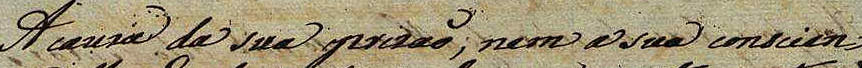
A cauza da sua prizaõ, nem a sua conscien
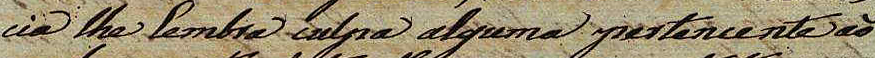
cia lhe Lembra culpa alguma pertencente aõ
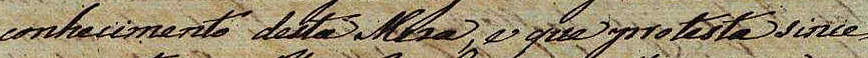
conhecimento desta Meza, e que protesta since
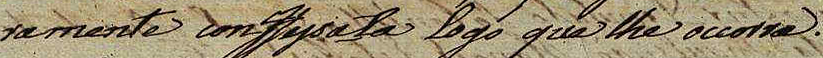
ramente conffessa-la Logo que lhe occorra.
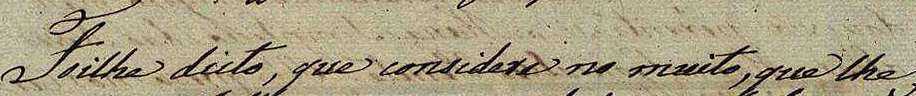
Foilhe dicto, que considere no muito, que lhe
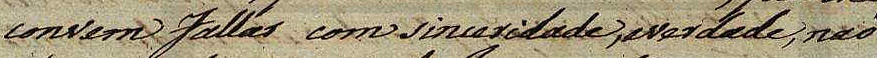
convem fallar com sinceridade, e verdade, naõ
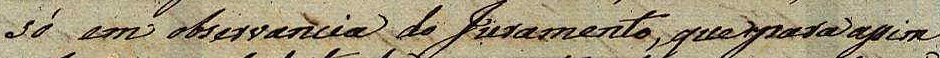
só em observancia do Juramento, quer para assim
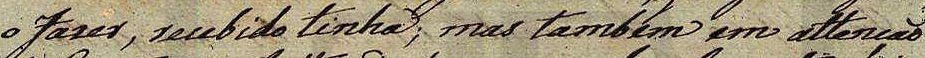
o fazer, recebido tinha; mas também em attençaõ
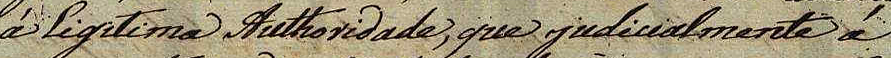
á Legitima Authoridade, que judicialmente a
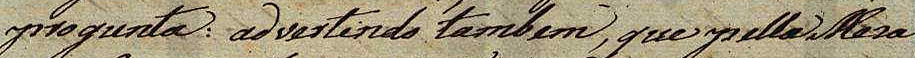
progunta: advertindo tambem, que pella Meza
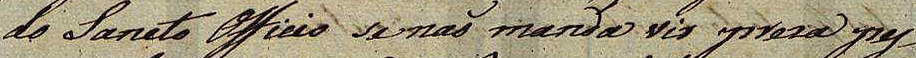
do Sancto Officio se naõ manda vir preza pes
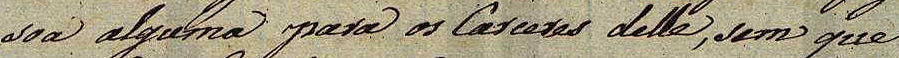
soa alguma para os Carceres delle, sem que
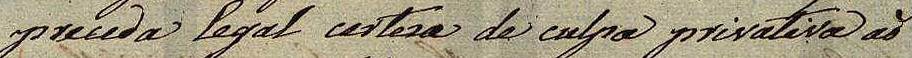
preceda Legal certeza de culpa privativa aõ
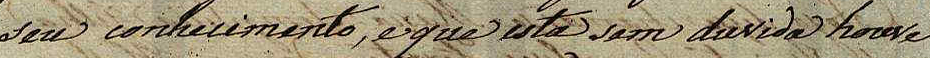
seu conhecimento, e que esta sem duvida houve
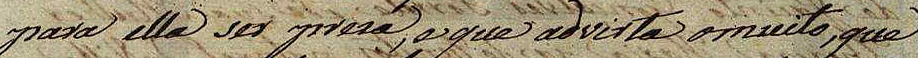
para ella ser preza, o que advirta o muito, que
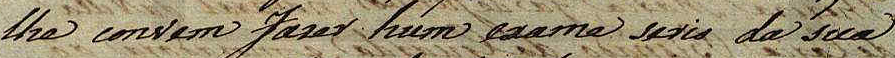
lhe convem fazer hum exame seria da sua
